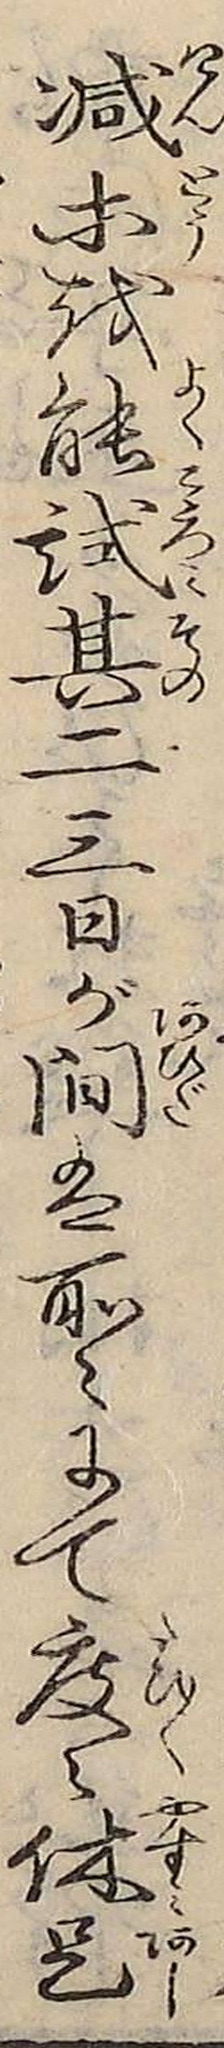減等を能試其二三日が間は所々にて度々休足
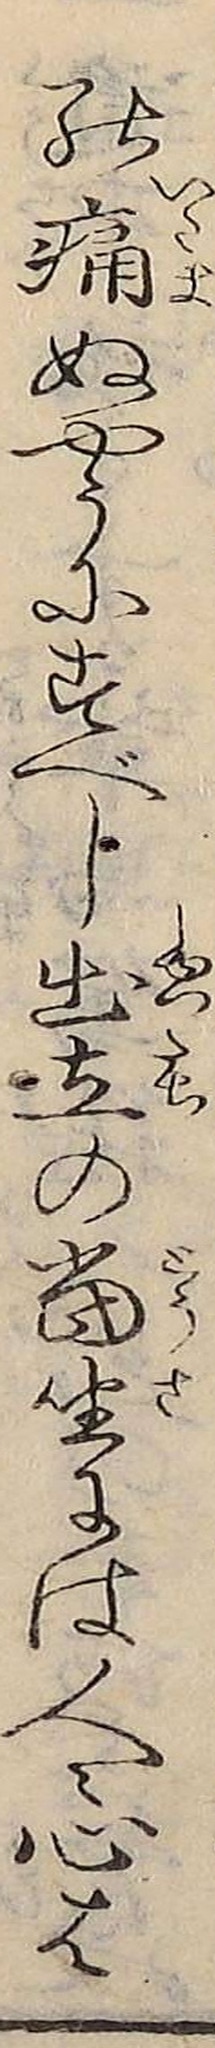の痛ぬやうにすべし出立の当坐には人々心は
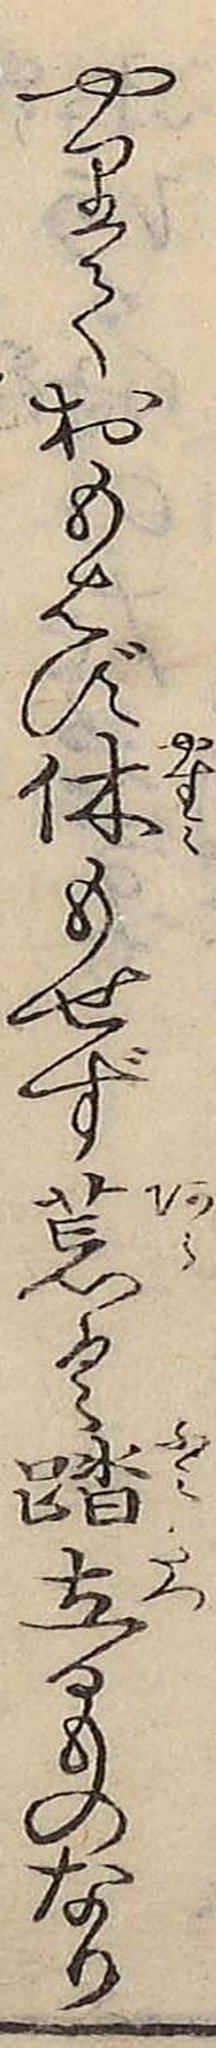やりておもはず休もせず荒く踏立るものなり
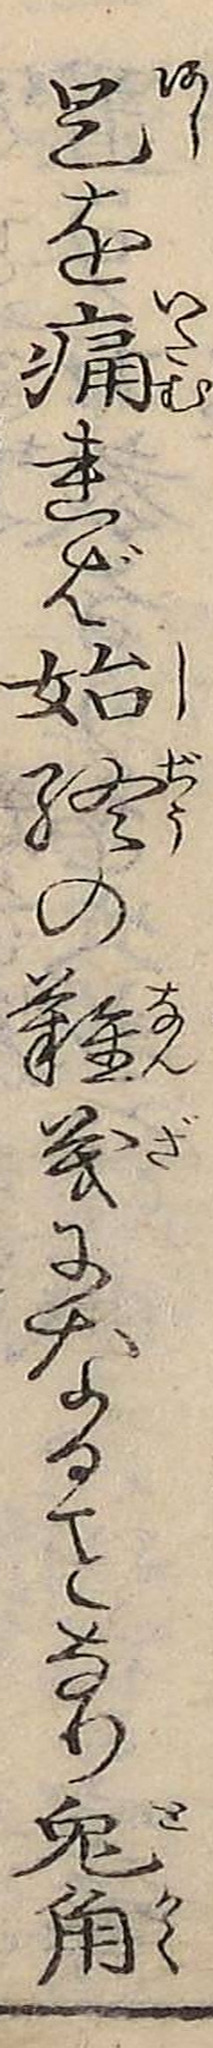足を痛れば始終の難義になることなり兎角
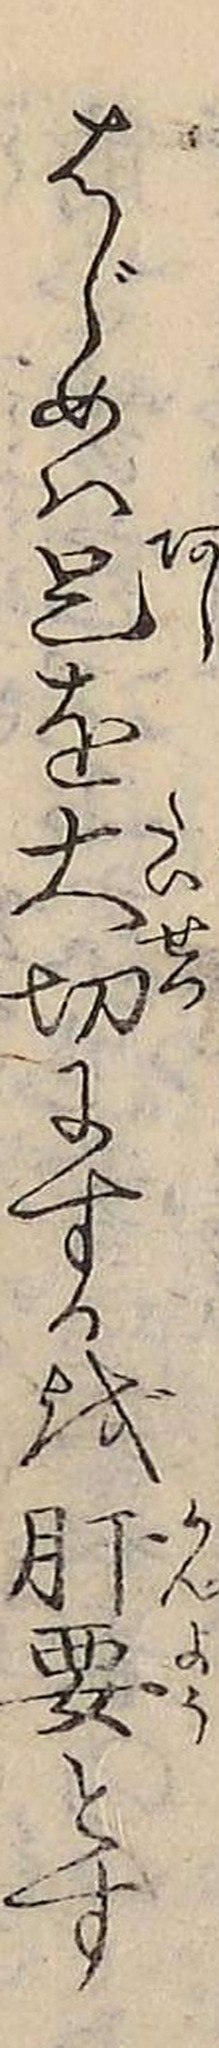はじめは足を大切にするを肝要とす
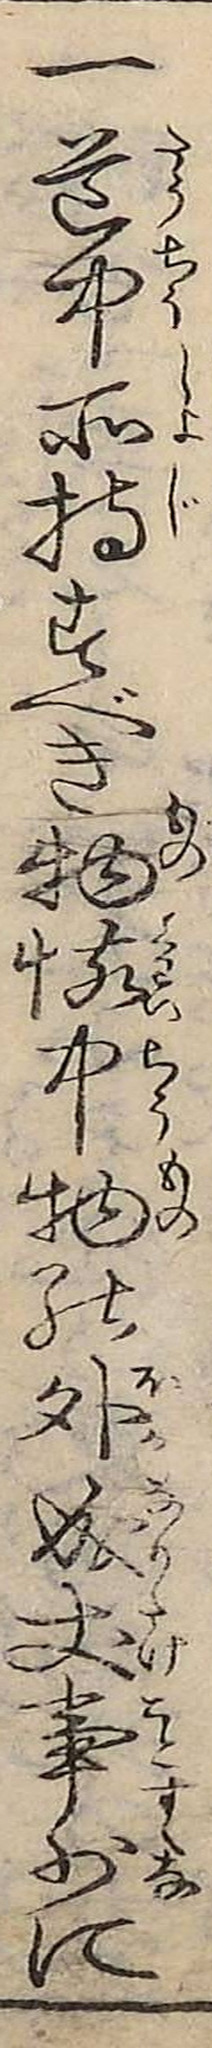一道中所持すべき物懐中物の外成丈事少に
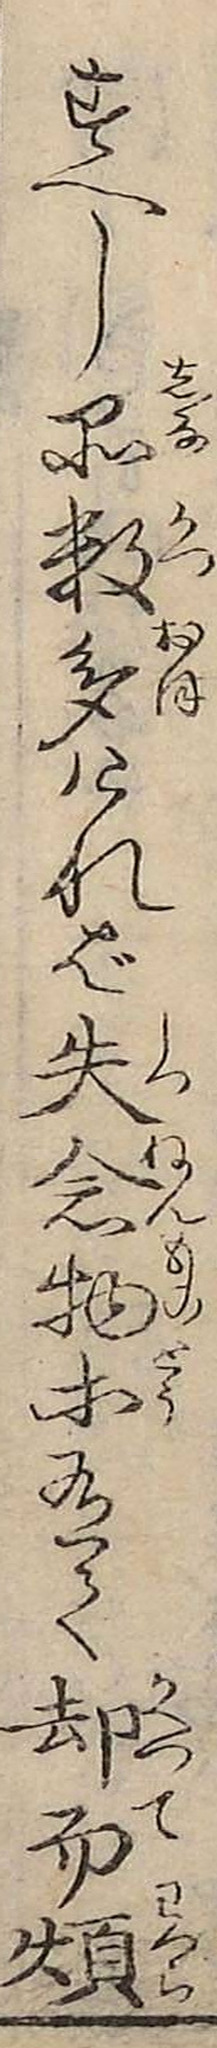すへし品数多ければ失念物等有て却而煩

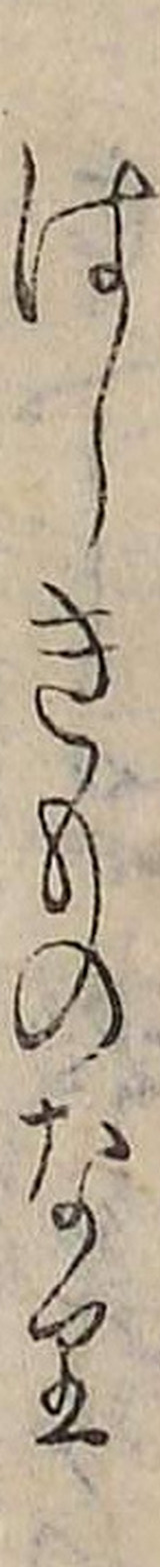はしきものなり
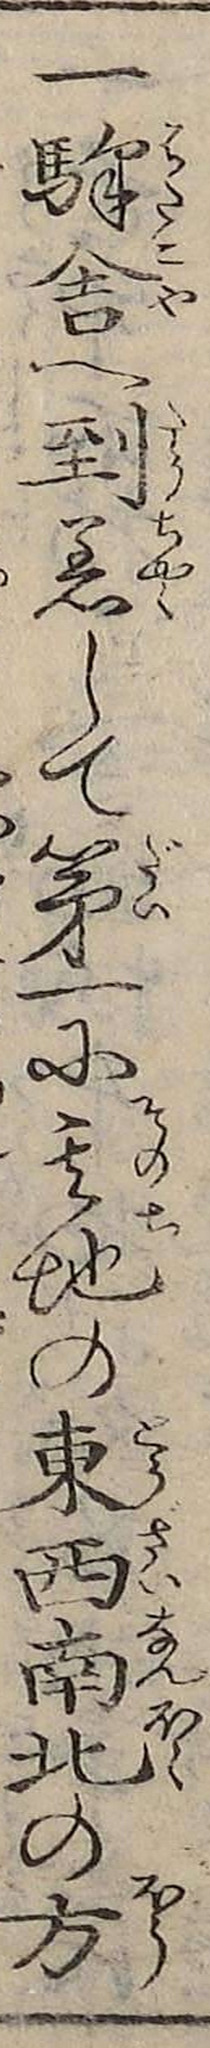一駅舎へ到着して第一に其地の東西南北の方
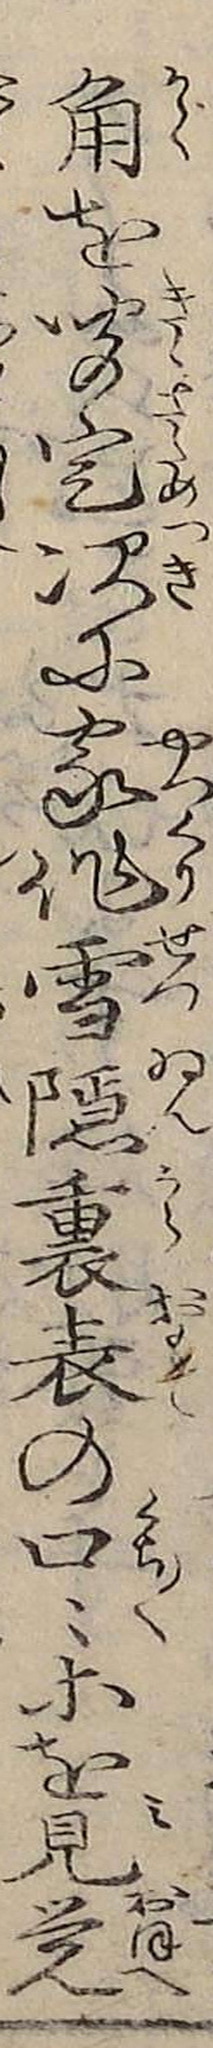角を聞定次に家作雪隠裏表の口々等を見覚
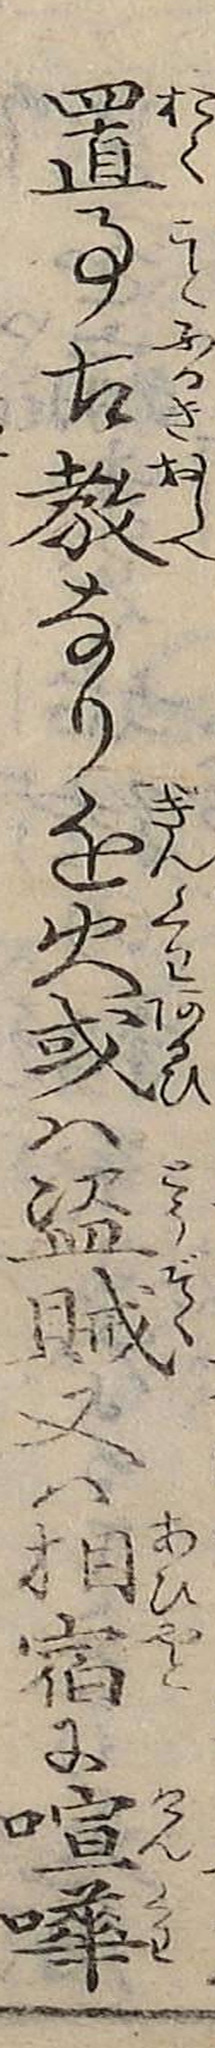置事古教なり近火或は盗賊又は相宿に喧嘩
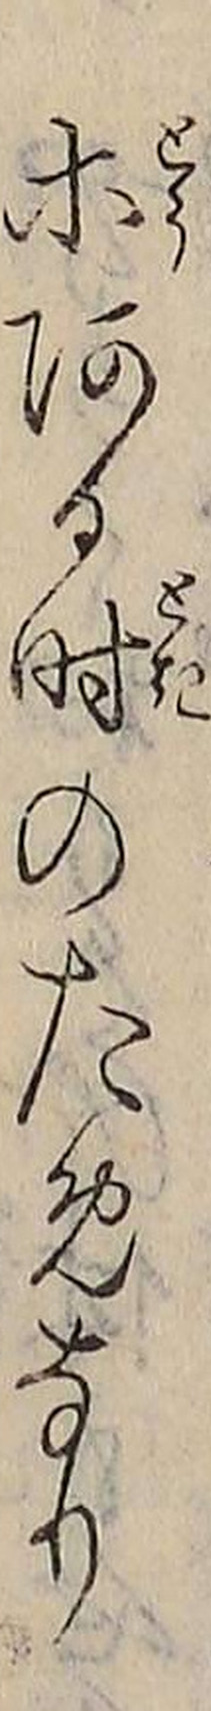等ある時のためなり
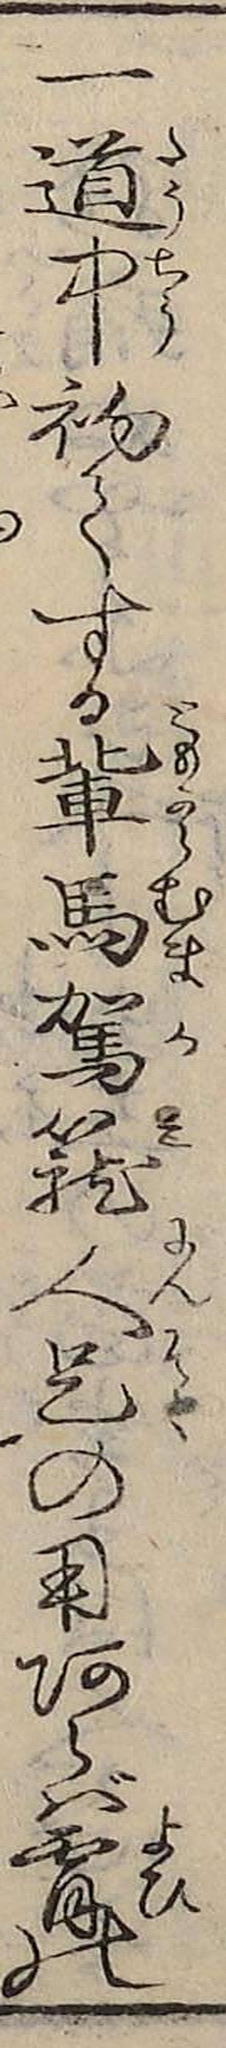一道中初てする輩馬駕籠人足の用あらば宵の
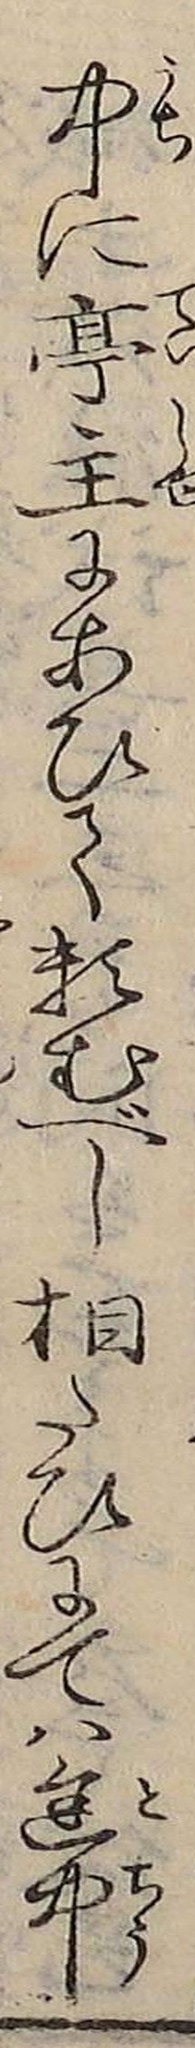中に亭主にあひて頼むべし相たひにては途中
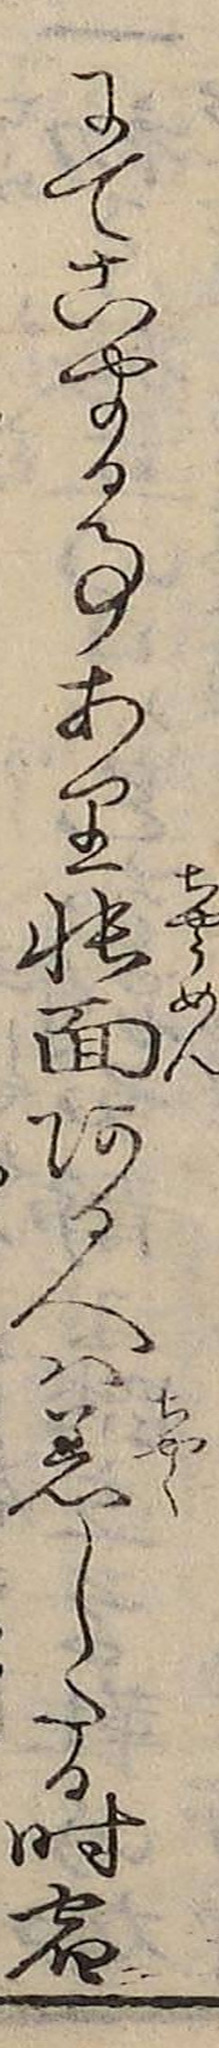にてこまる事あり帳面ある人は着したる時宿
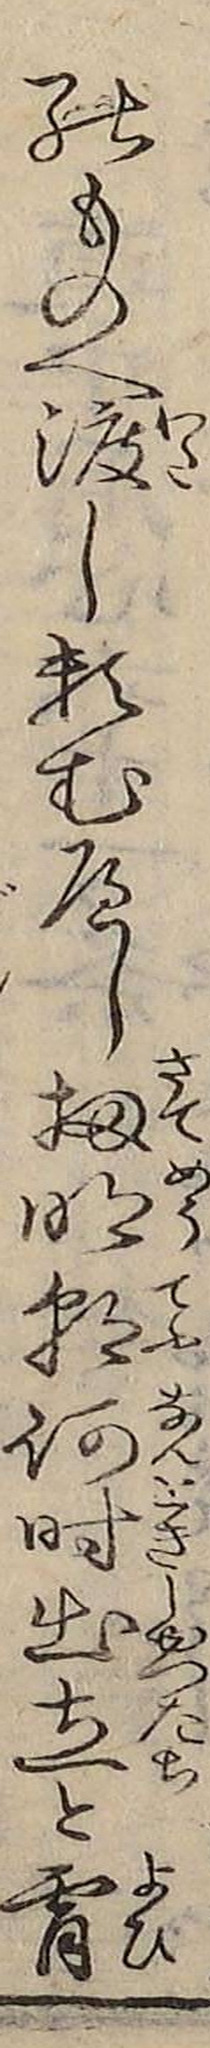のものへ渡し頼むへし扨明朝何時出立と宵
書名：旅行用心集
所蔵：神戸大学附属図書館 国文学研究資料館
